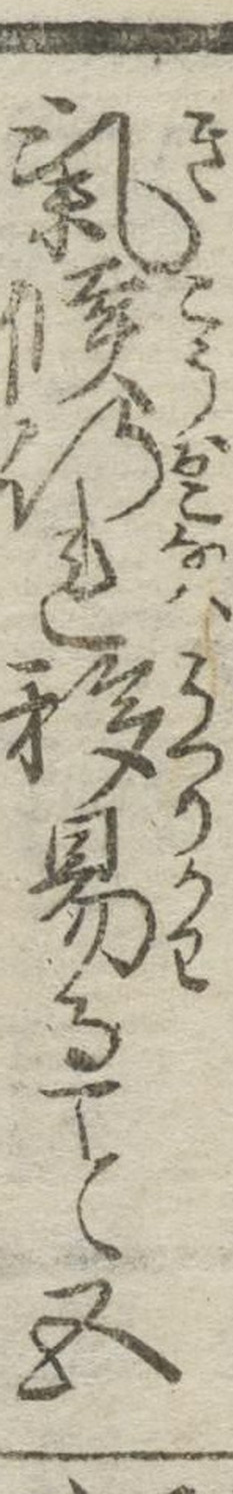気候行れ移易ること五
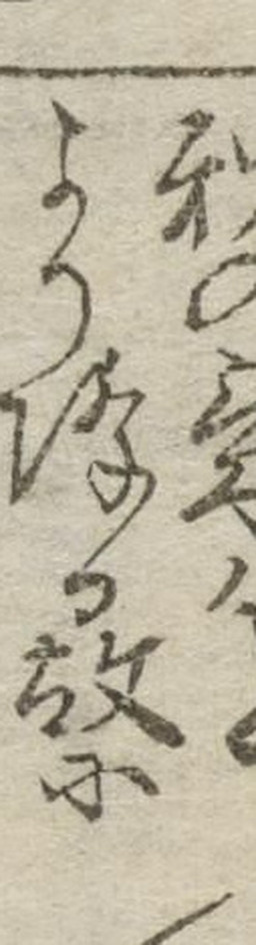より降る故に
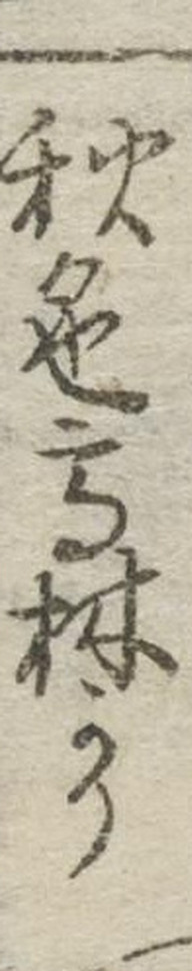秋色高林より
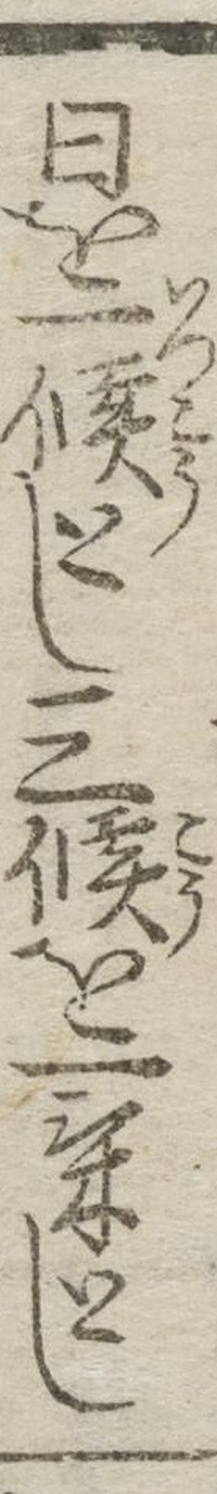日を一候とし三候を一気とし
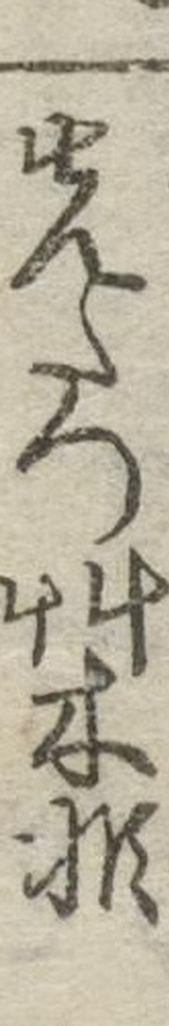先たつ草木非
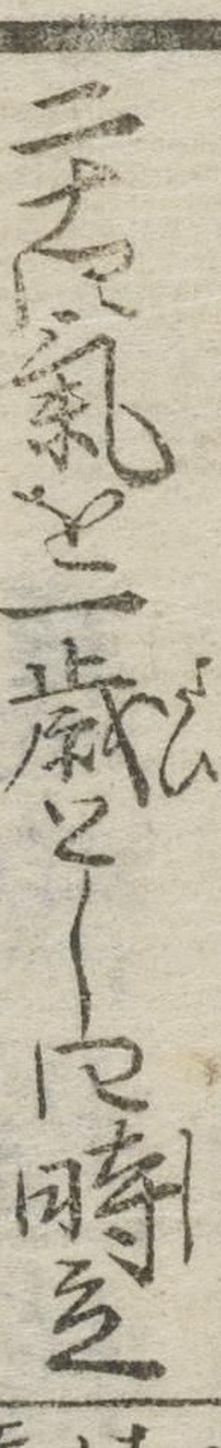二十四気を一歳とし四時立
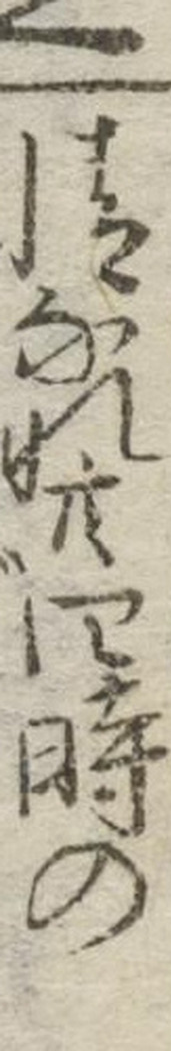情なれ共四時の
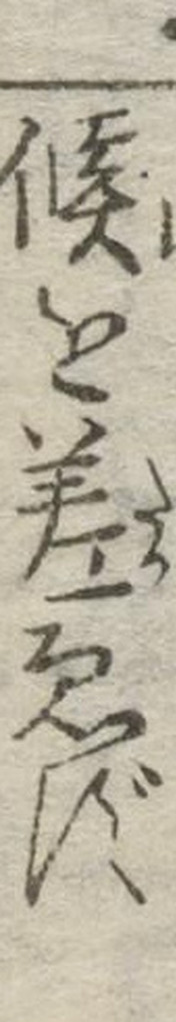候を差ゑず
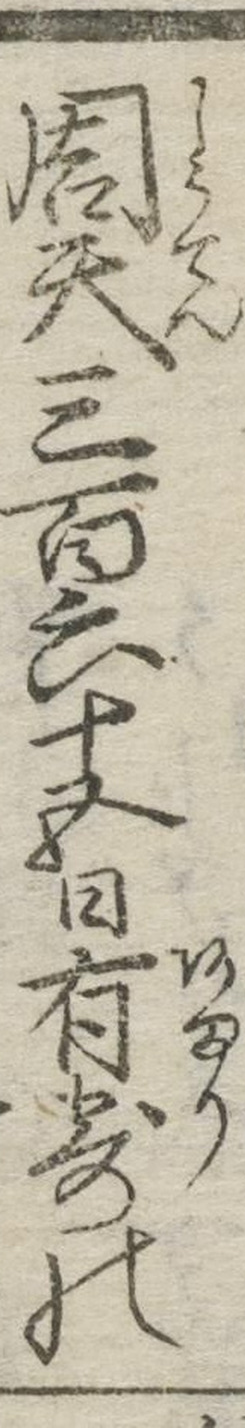周天三百六十五日有奇の
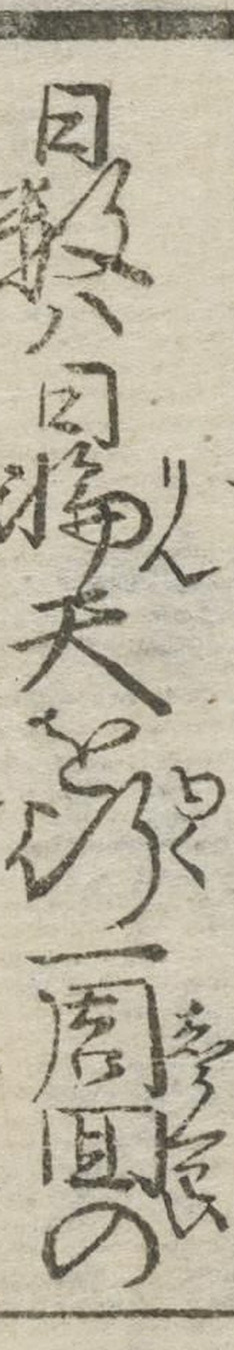日数は日輪天を行一周回の
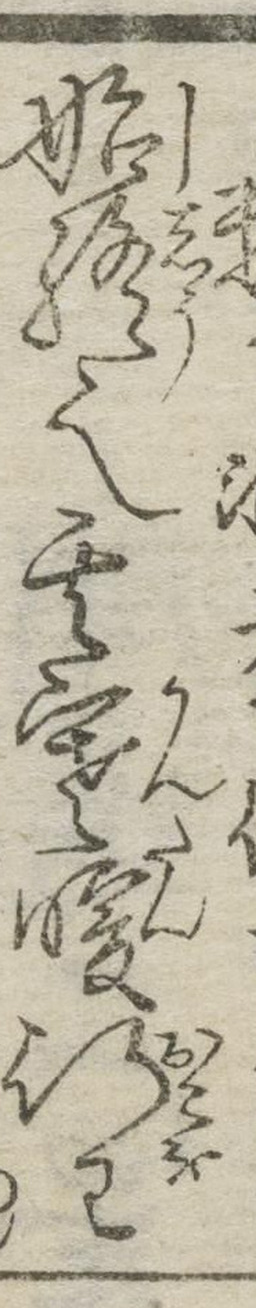始終なり其寒暖行わ
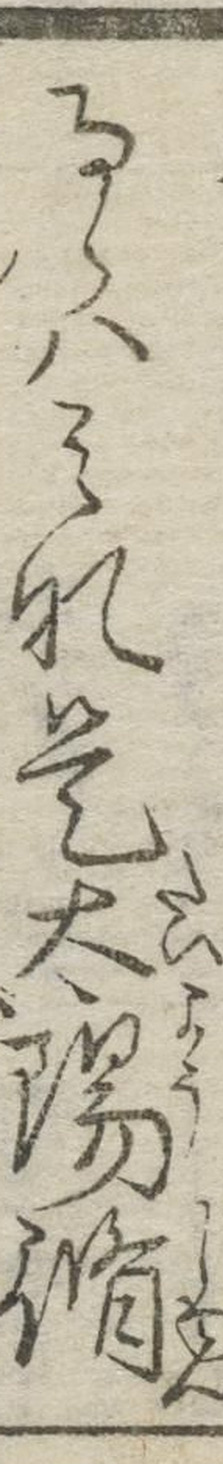るゝは皆是太陽循
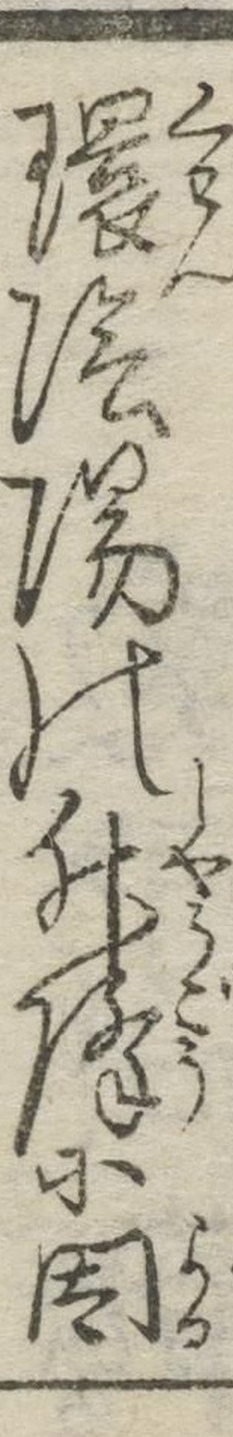環陰陽の升降に因
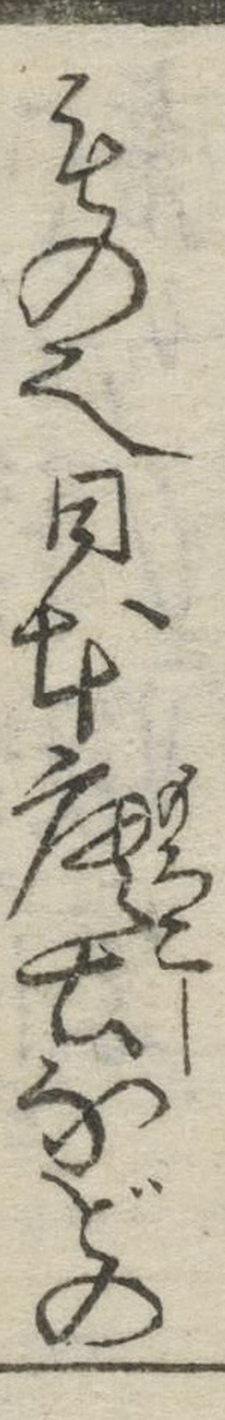もの也日本唐土などの
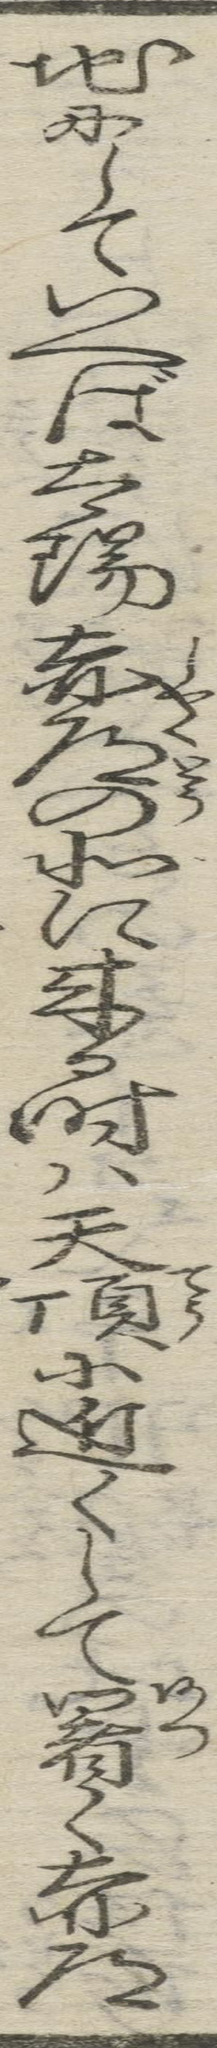地にしていへば太陽赤道の北に来る時は天頂に近くして暑く赤道
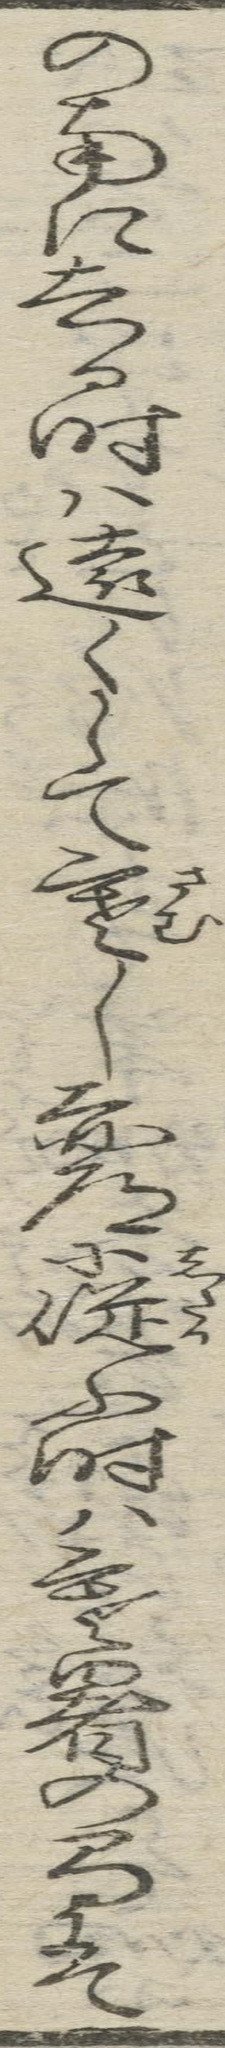の南に去る時は遠くして寒し赤道に従ふ時は寒暑の間にて
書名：訓蒙天地辨　天
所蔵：東京大学地震研究所図書室 Earthquake Research Institute Library, The University of Tokyo, JAPAN
